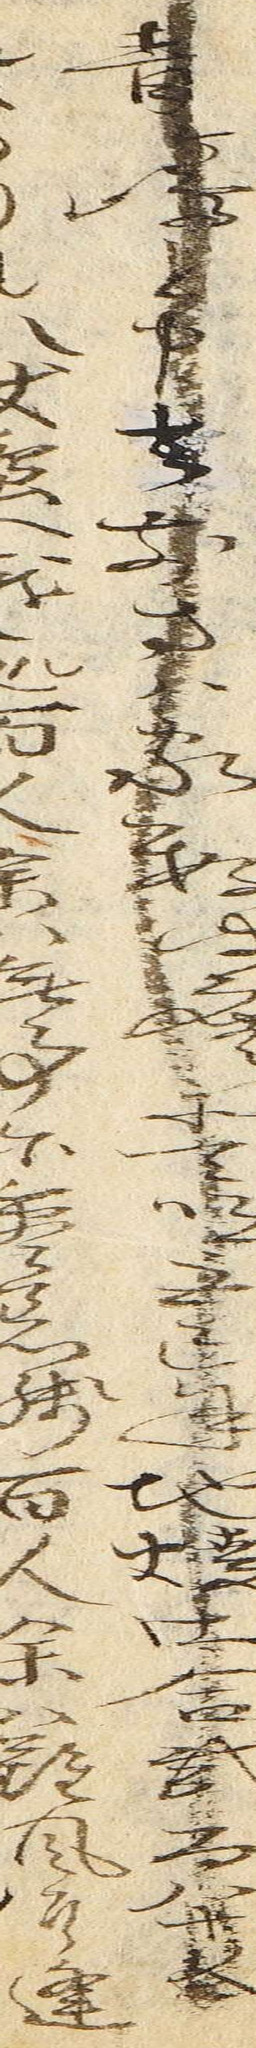はかりも八丈島へ渡候処百人余ハ無事に参着残百人余ハ難風に逢
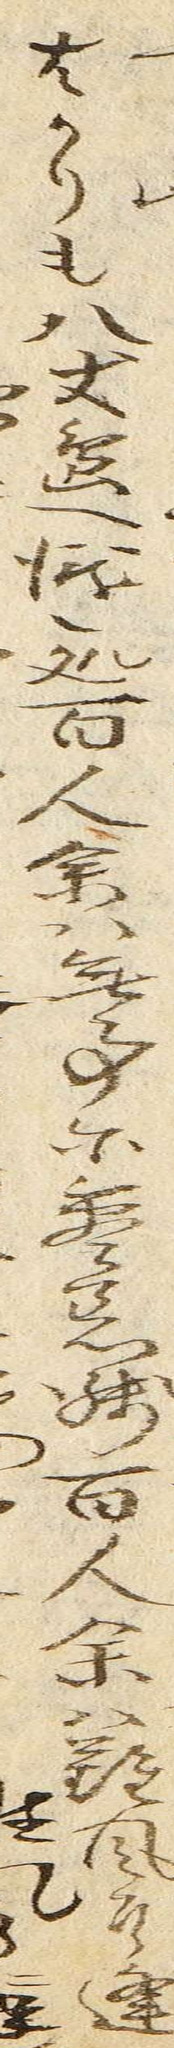はかりも八丈島へ渡候処百人余ハ無事に参着残百人余ハ難風に逢
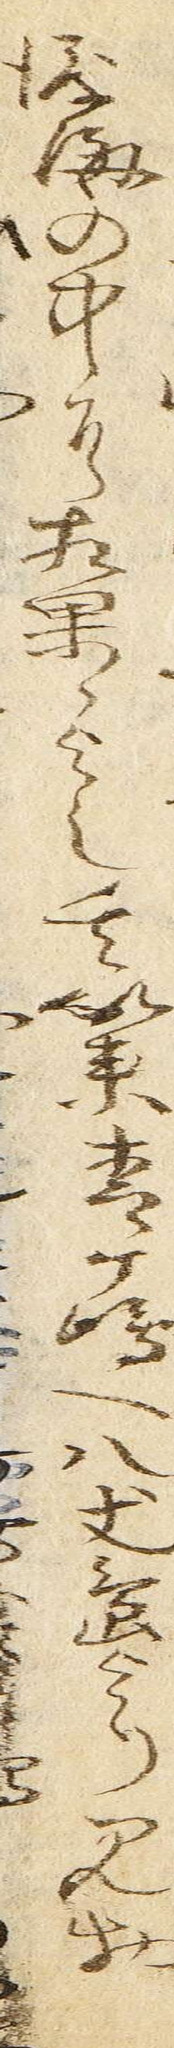渡海の中に相果候よし其以来青ケ嶋へ八丈島より見物
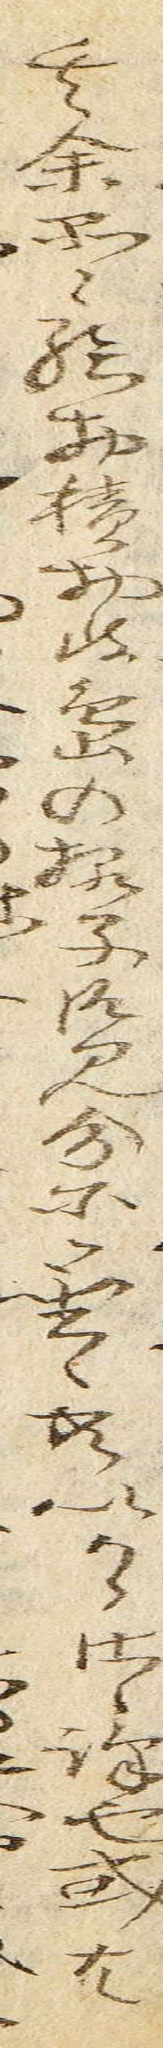其余品々給物積物致島の様子御見分に御座候共いかゝ仕候訳や或は
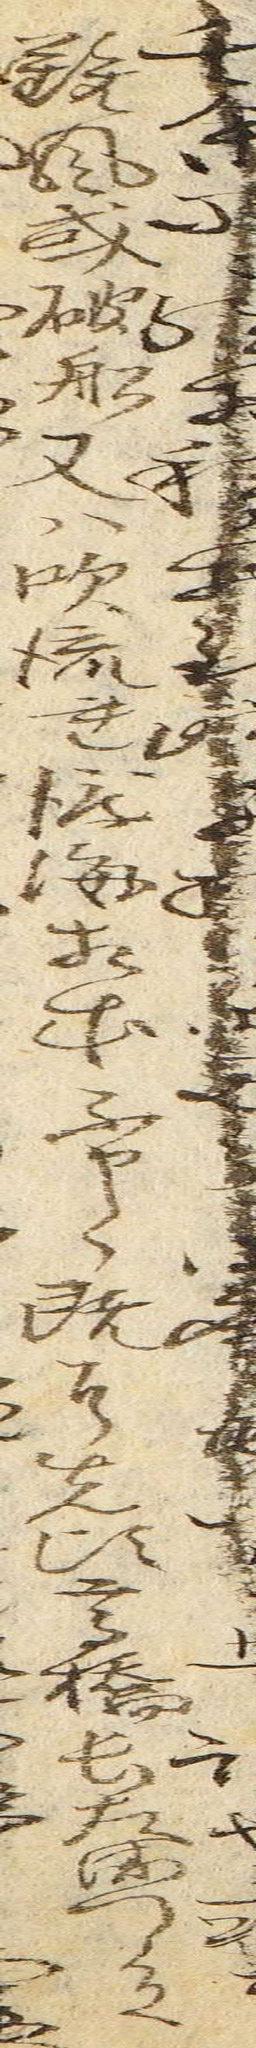難風或破船又ハ吹流れ渡海相成不申候既に先頃高橋長左衛門殿
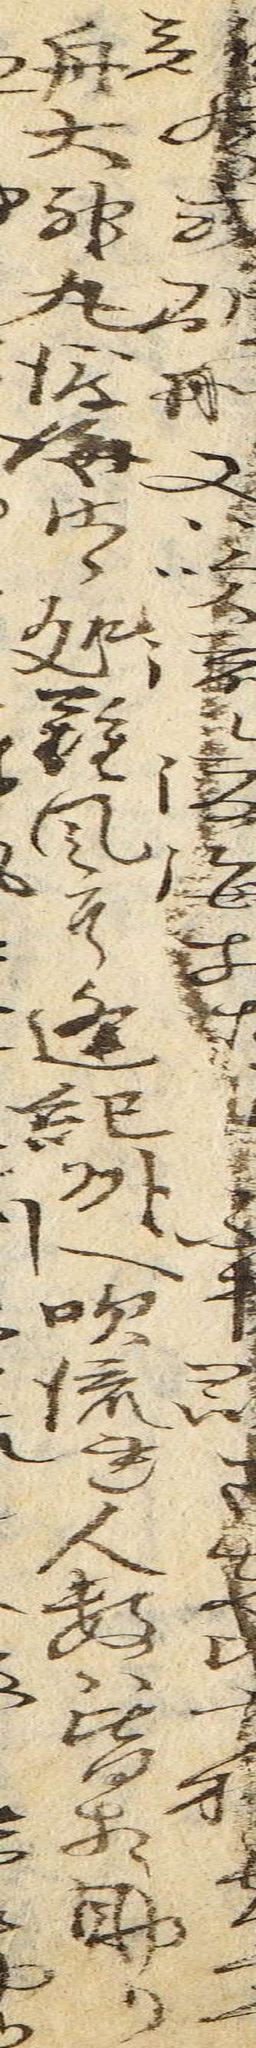舟大神丸渡海仕候処難風に逢紀州へ吹流れ人数ハ皆相助り

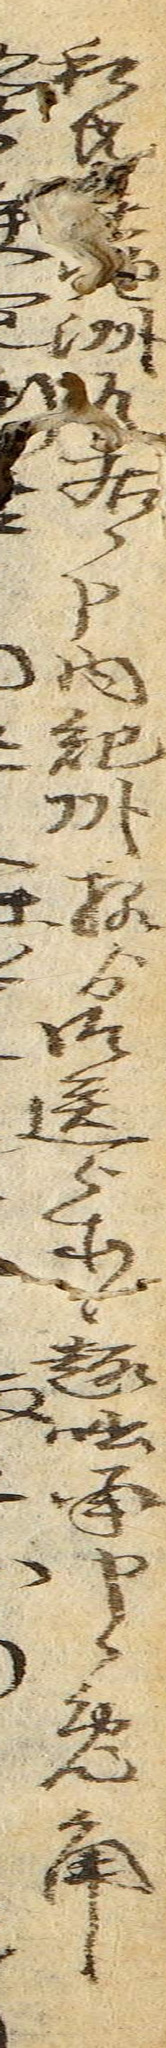私共鉄炮洲居申内紀州様ゟ御送被成候趣咄承申候兎角
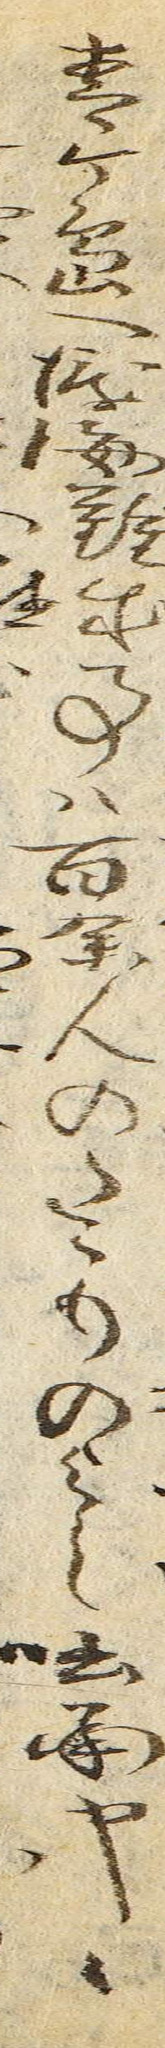青ケ島へ渡海難成事ハ百余人のたゝりのよし咄承申候
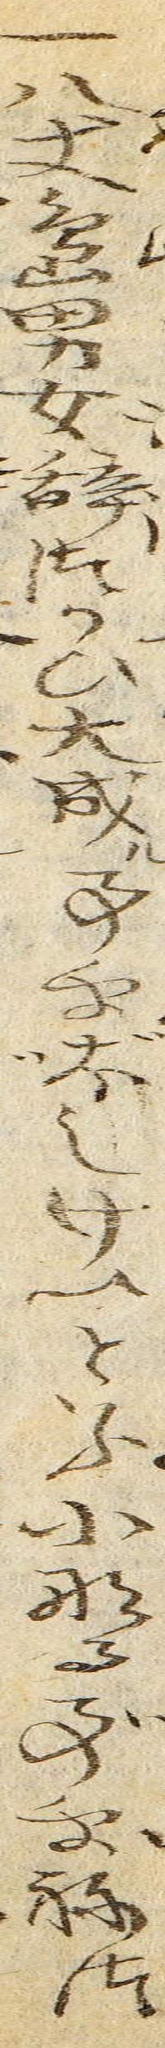一八丈島男女辞つかひ大成ル事をぶしけいといふ小なる事をねつ
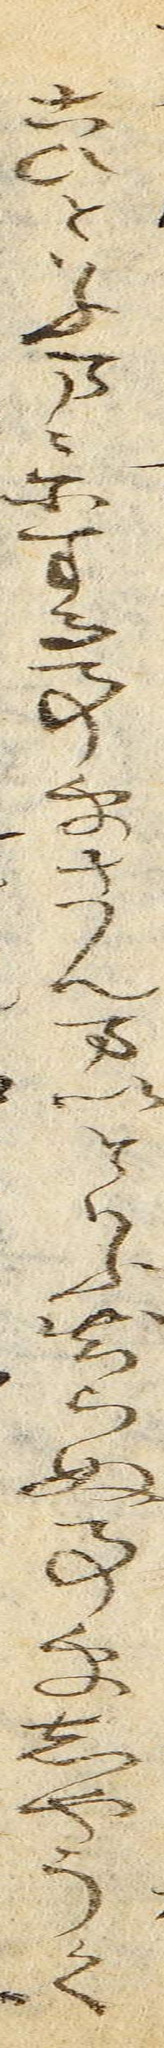こひといふまゝにする事をさんまいといふ知らぬ事をしやうく
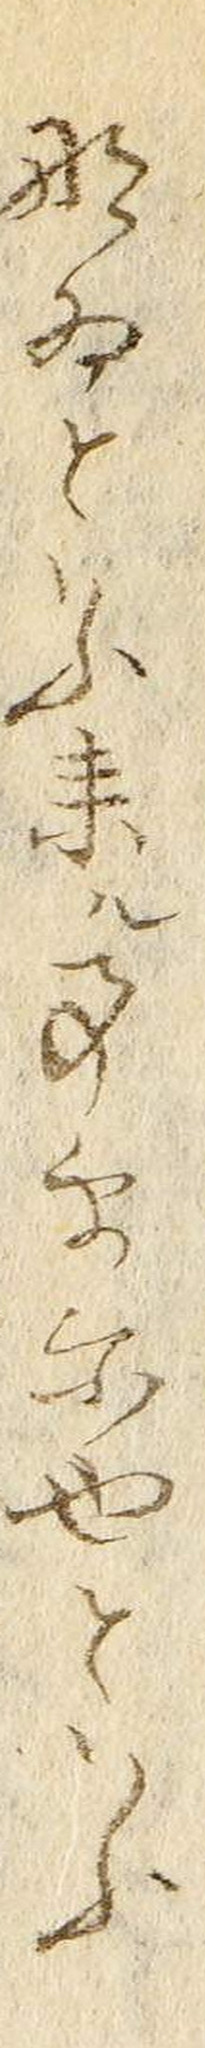なゐといふ来ル事をにやといふ
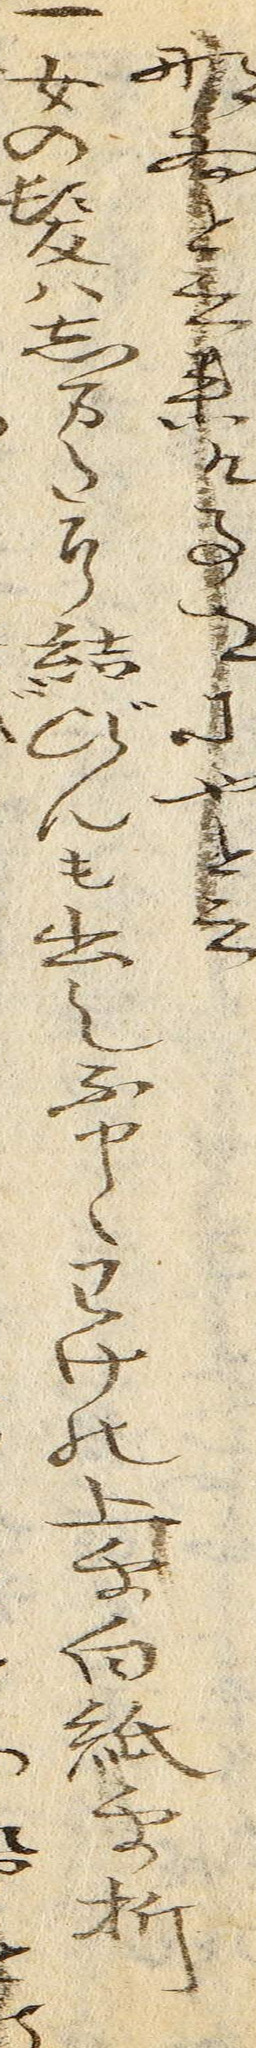一女の髪ハしまたに結びんも出し不申候わけの上を白紙を折
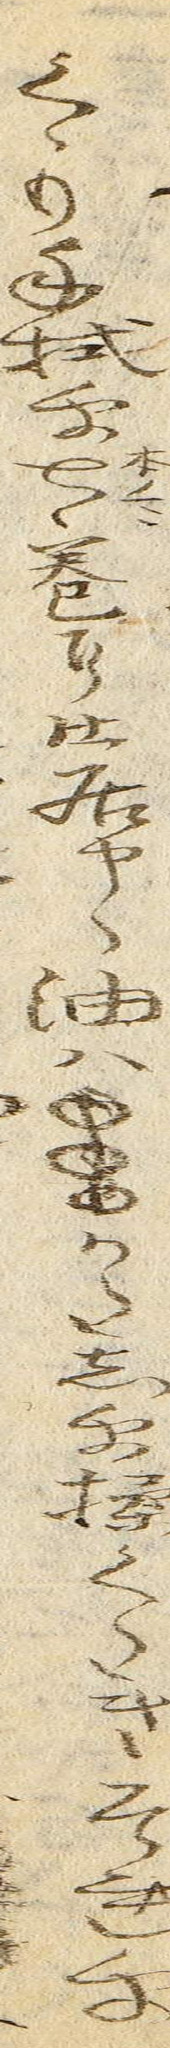くゝり手拭をちゝ巻に仕居申候油ハかたしを揉くたきそれを
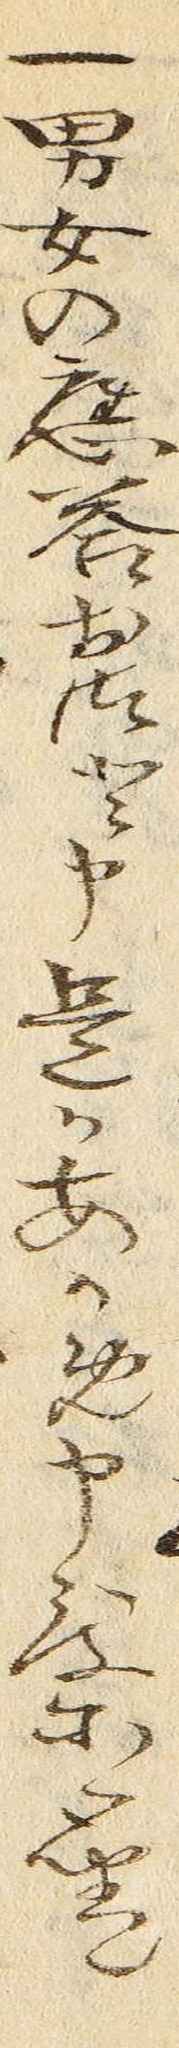一男女の応答おつと申是ハあかめ申度に御座候
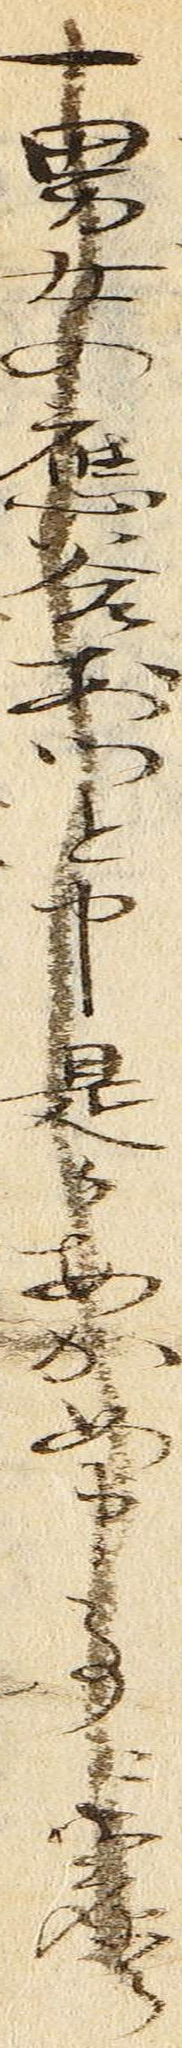一男女の応答おつと申是ハあかめ申度に御座候
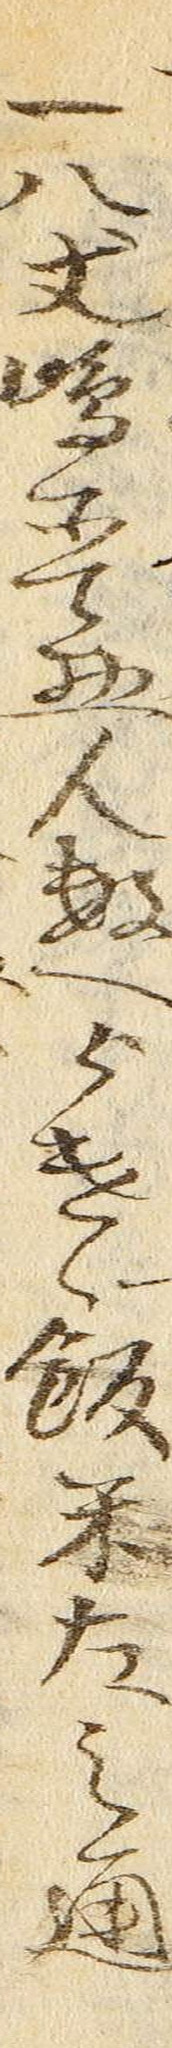一八丈嶋にて惣人数へ被遣候飯米左之通
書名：無人島漂流書付
